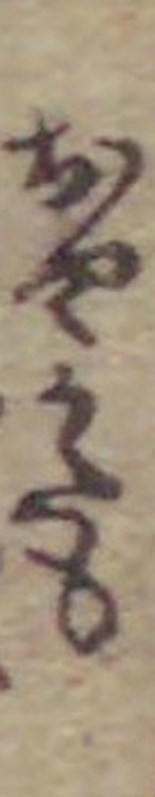おやかたも
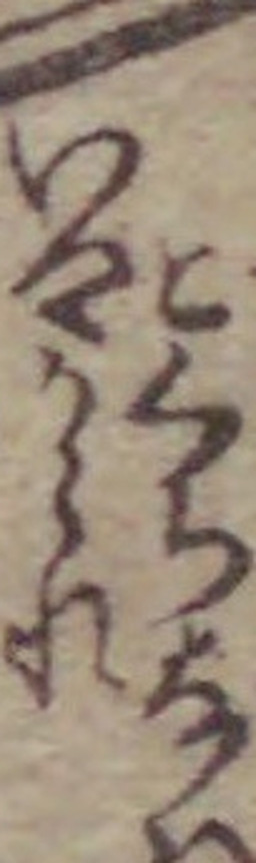いやかられ
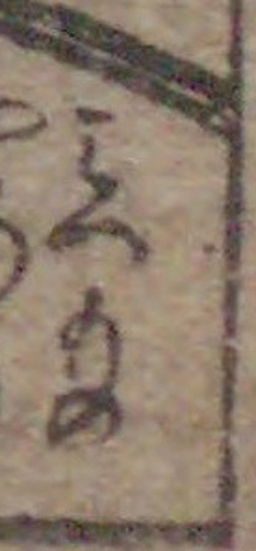みつもの
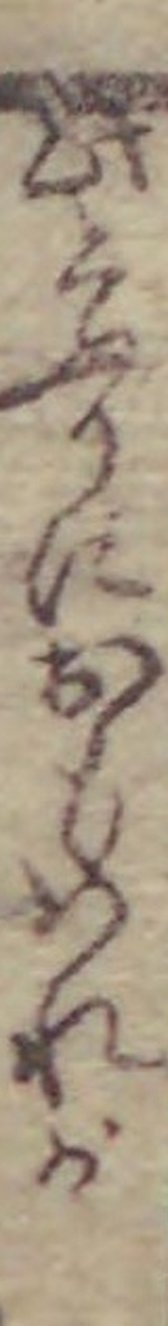此とふりにおもいれか
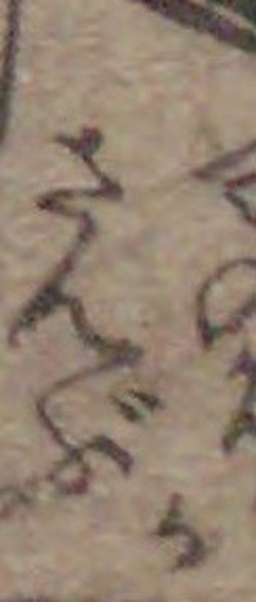さんぶ
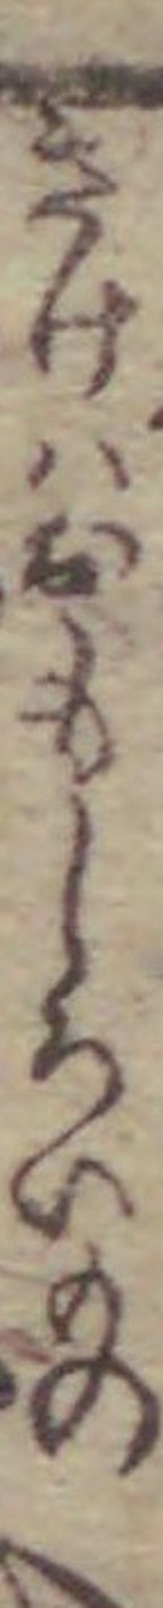きけはおもしろいもの
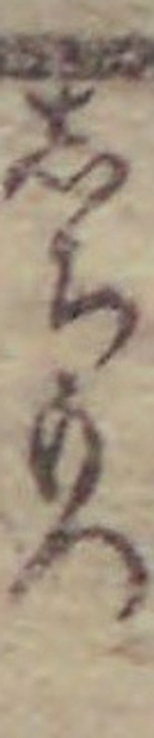しちもつ
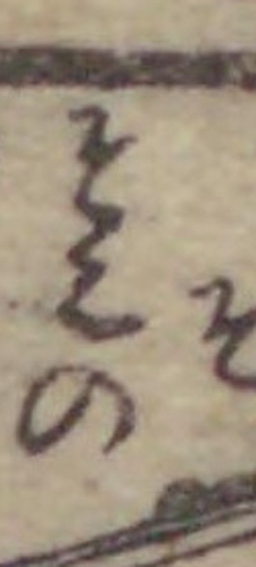そこの
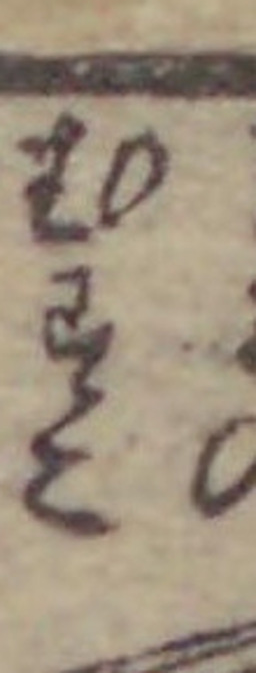むすこ
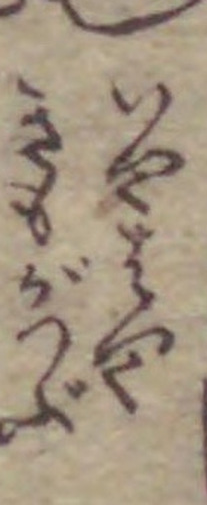いやはや
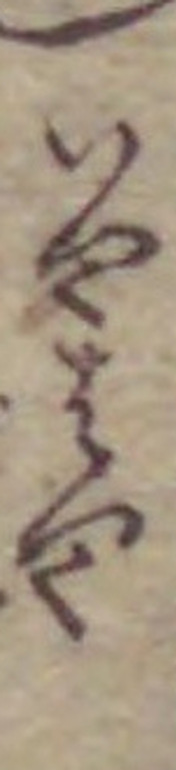いやはや
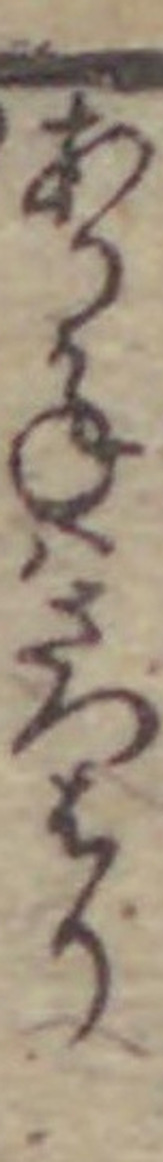ありかねはさつはり
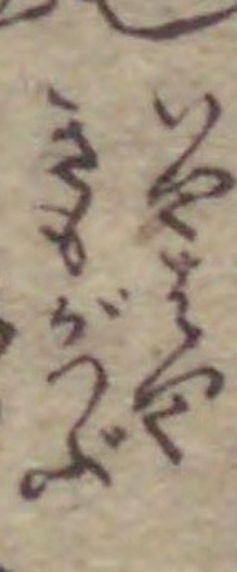きもがつぶ
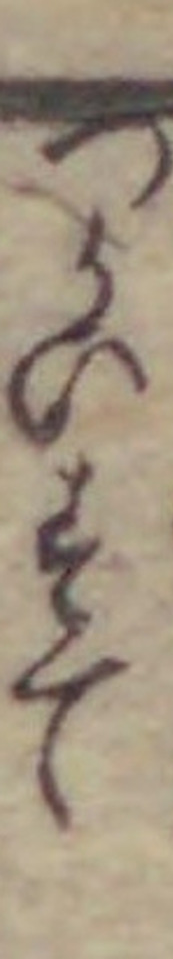つかいすて
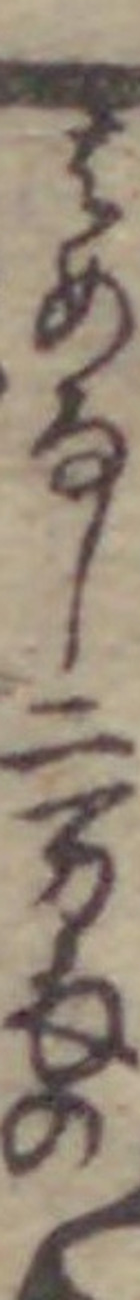はめなし二万両の
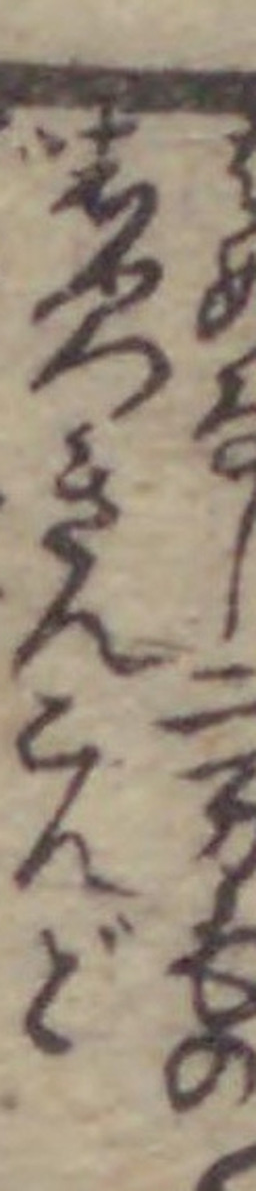しやつきんこんど
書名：御代の御寶
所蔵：国立国会図書館 National Diet Library, JAPAN
